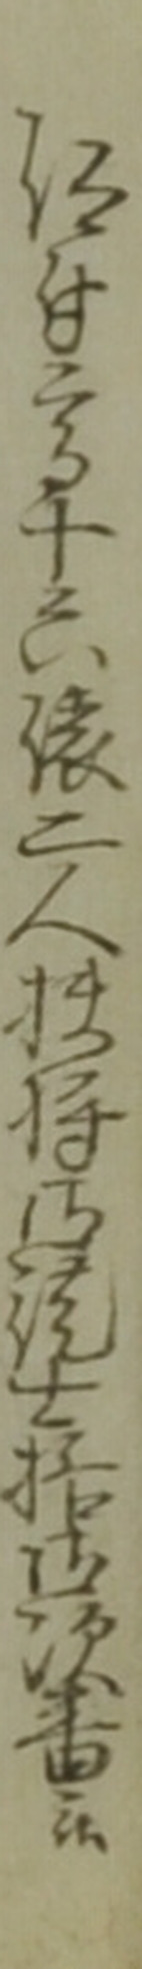仰付高十六俵二人扶持御徒士格御次番被
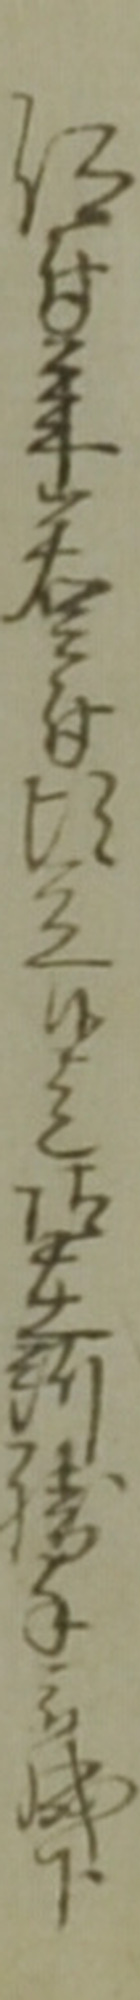仰付年若に付頃立候迄御在所勝手被成下

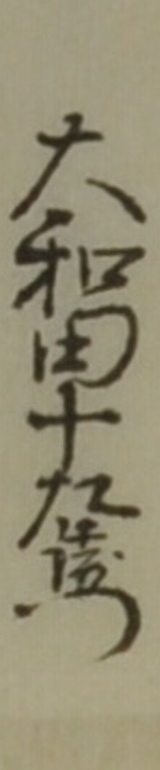大和田十左衛門
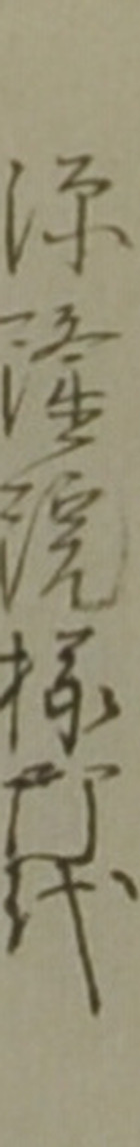源隆院様御代
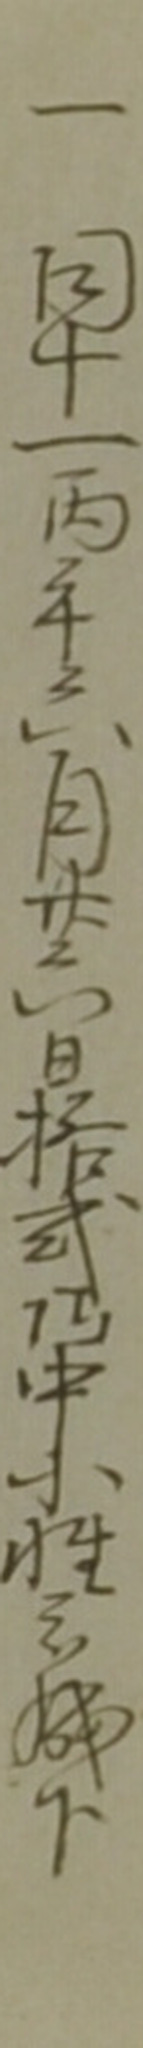一同十一丙午六月廿六日格式御中小性被成下
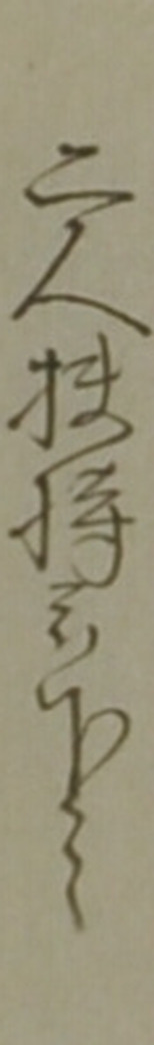二人扶持被下之
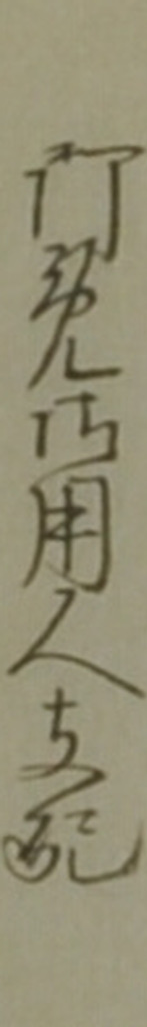御免御用人支配
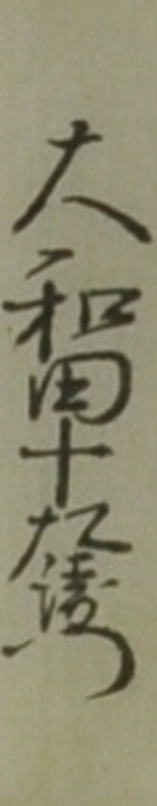大和田十左衛門
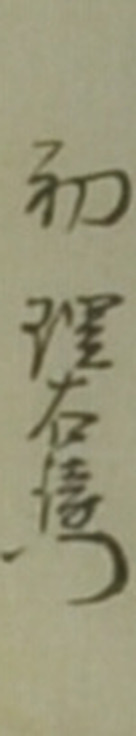初理右衛門

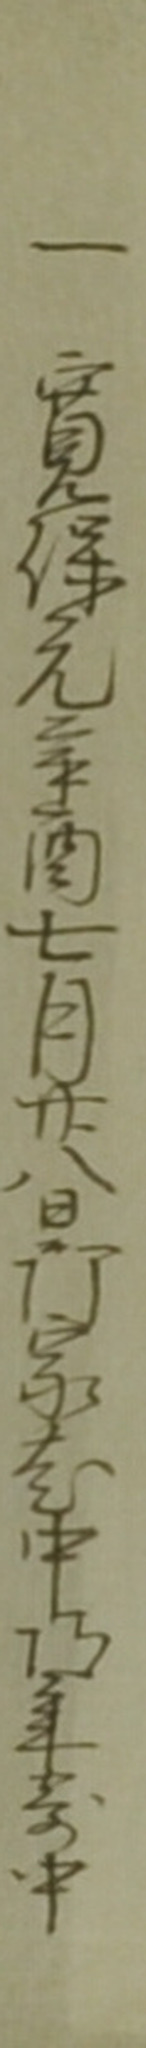一寛保元辛酉七月廿八日御家老中御年寄中
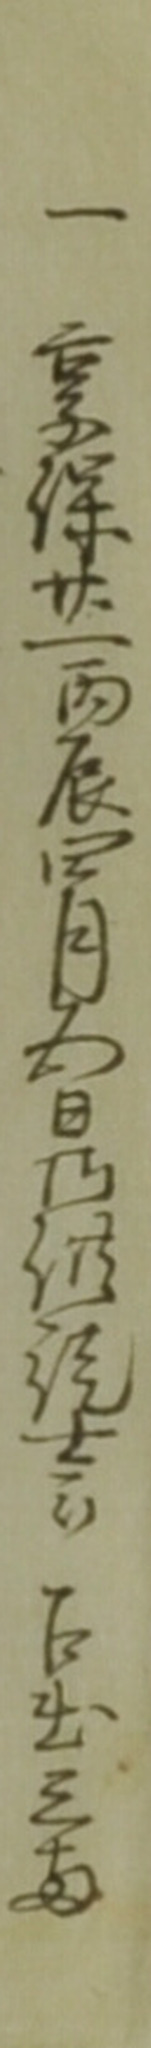一享保廿一丙辰四月五日御供徒士被召出三両
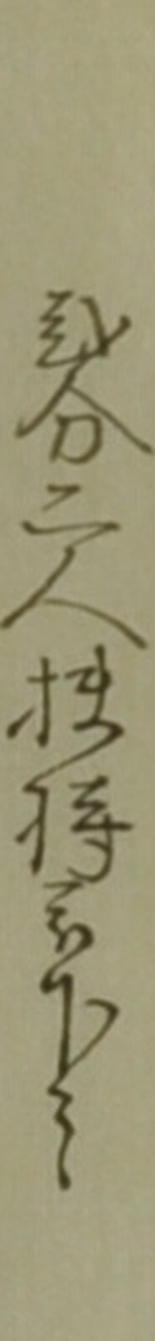弐分二人扶持被下之
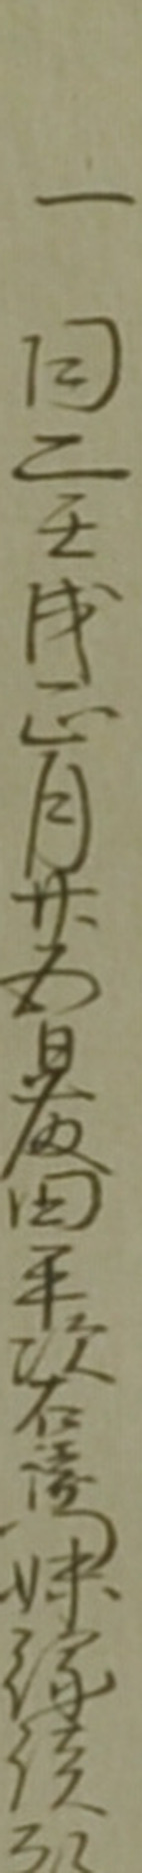一同二壬戌正月廿五日藤田平次右衛門妹縁談願済
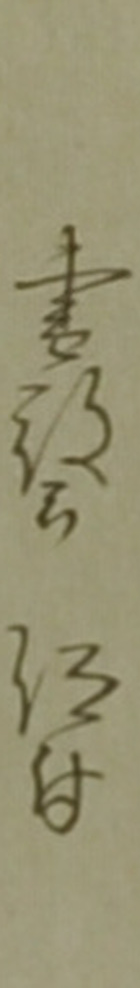書役被仰付
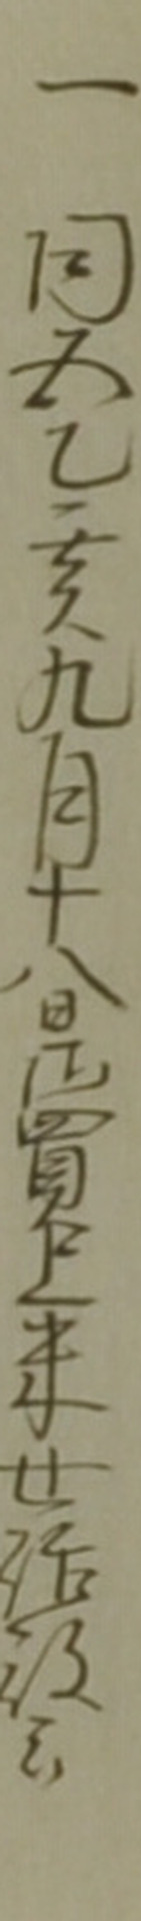一同五乙亥九月十八日御買上米世話役被
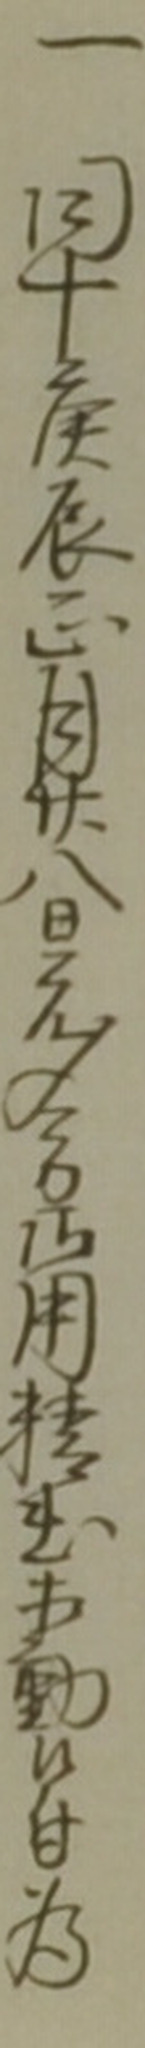一同十庚辰正月廿八日元〆方御用精出相勤候付為
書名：無足諸士勤仕録（三）
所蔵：伊那市立高遠町図書館・合同会社AMANE
